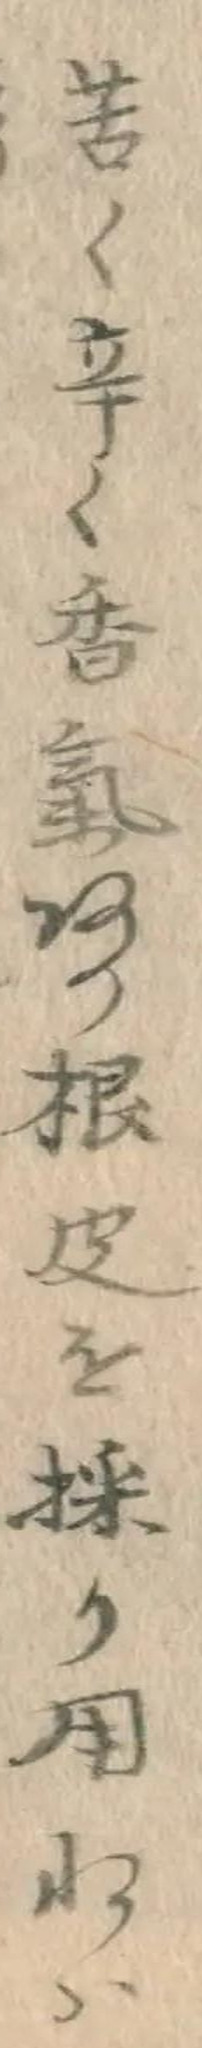苦く辛く香気あり根皮を採り用れは
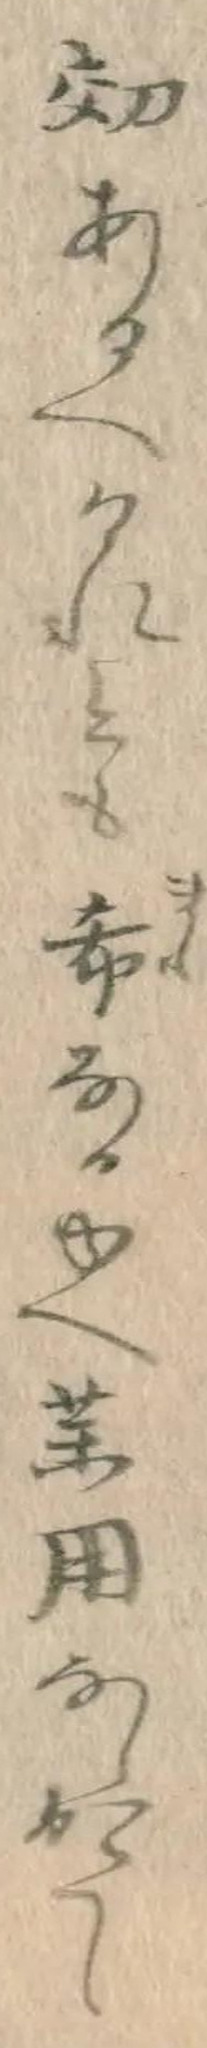効あるへけれとも希なるゆへ葉用なしかたし

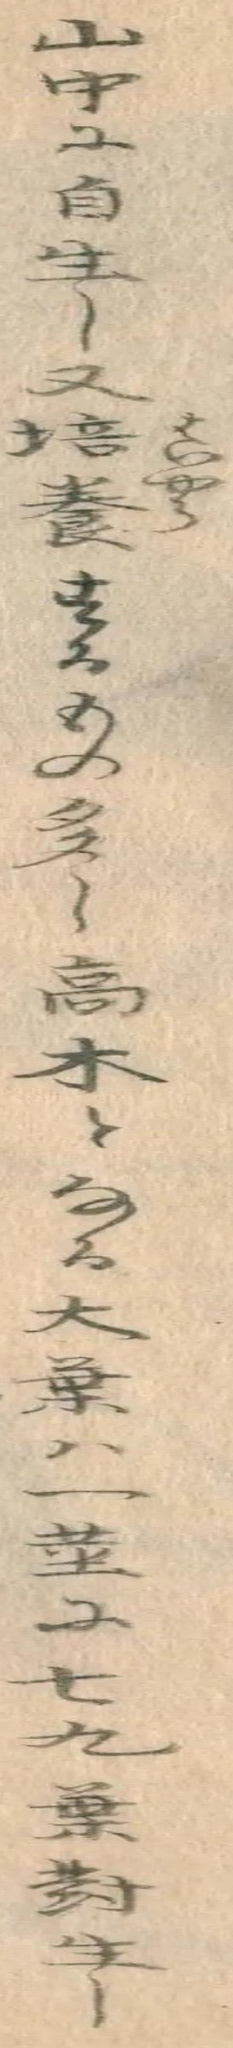山中に自生し又培養するもの多し高木となる大葉は一茎に七九葉対生し
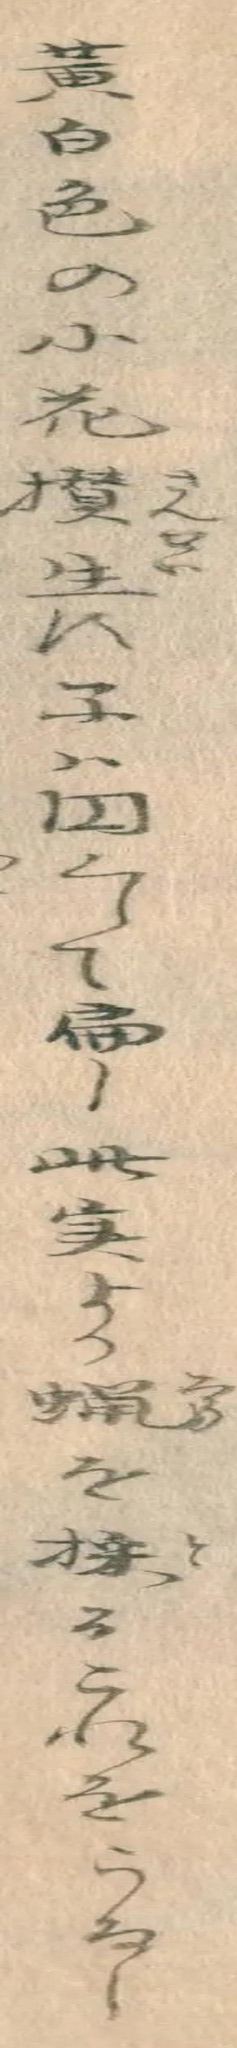黄白色の小花攅生す子は円くして扁し此実より蠟を採るこれをうるし
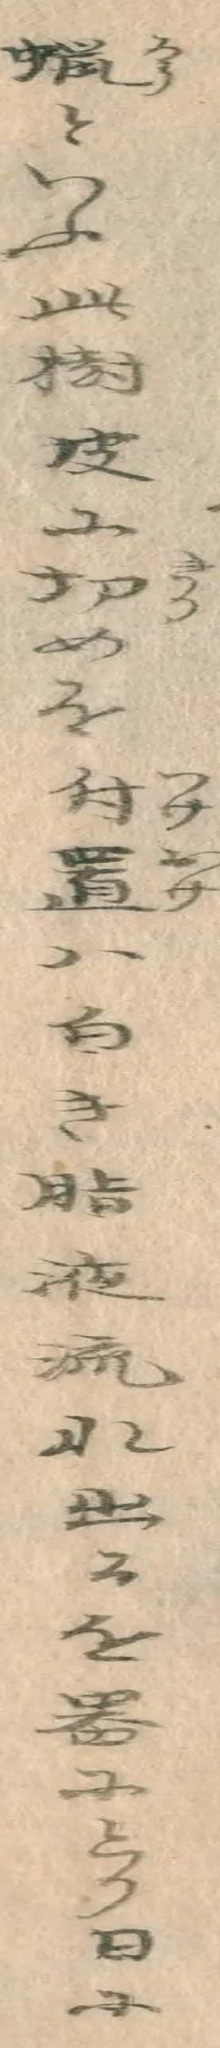臘といふ此樹皮に切めを付置は白き脂液流れ出るを器にとり日に
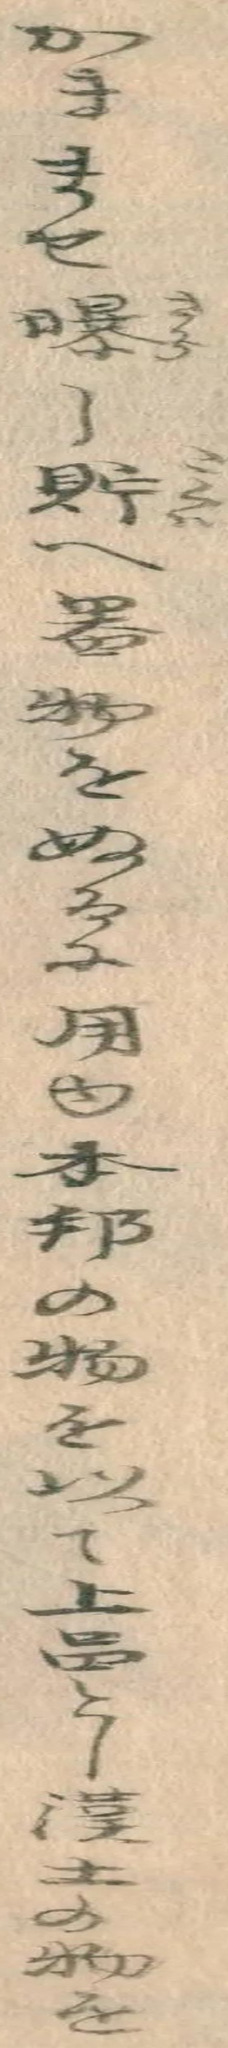かまませ＃曝し貯へ器物をぬるに用ゆ本邦の物を以て上品とし漢土の物を
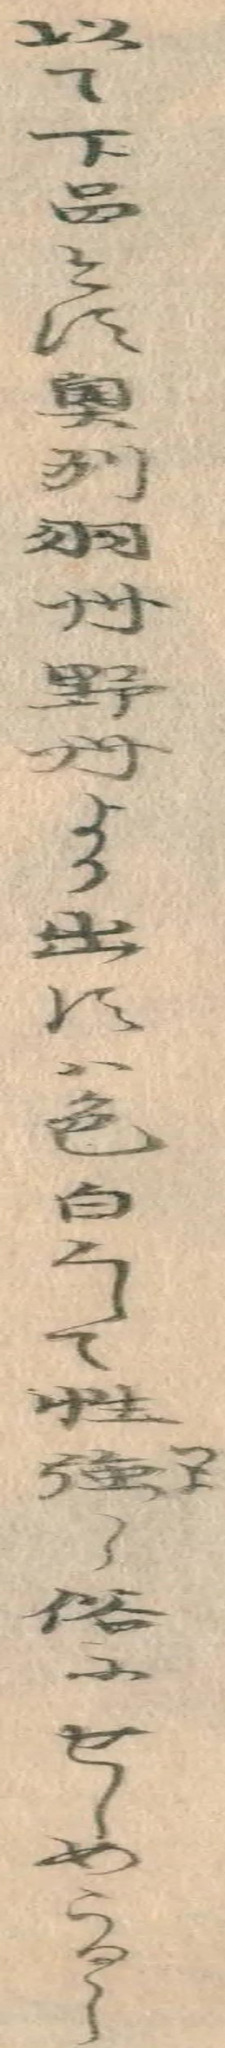以て下品とす奥州羽州野州より出すは色白くして性強し俗にせしめうるし
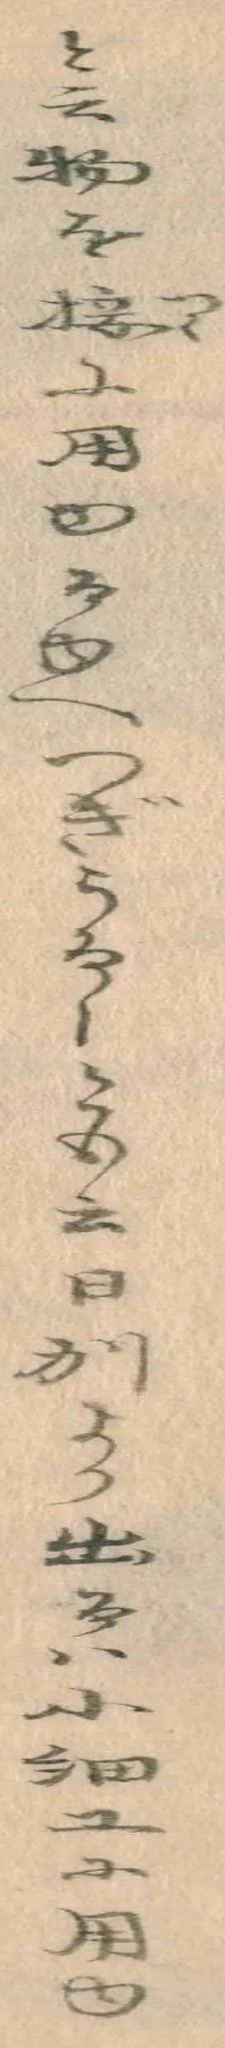と云物を接に用ゆるゆへつぎうるしとも云日州より出るは小細工に用ゆ
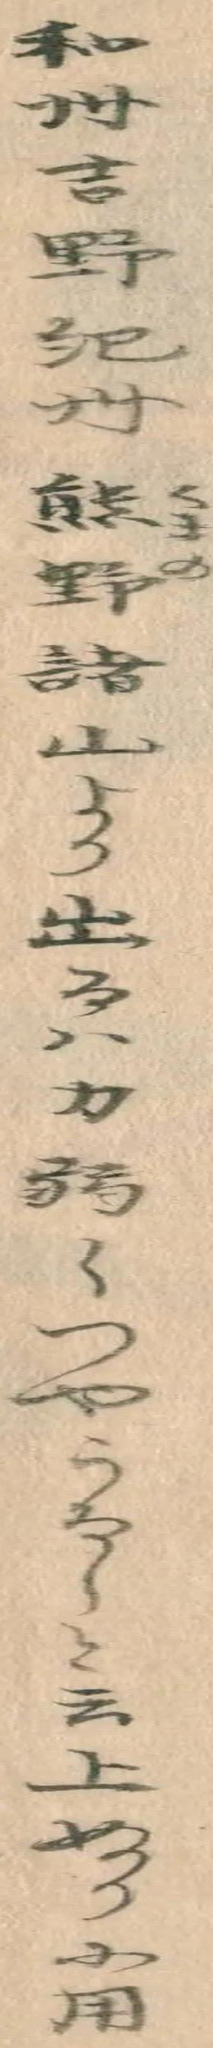和州吉野紀州熊野諸山より出るは力弱くつやうるしと云上ぬりに用
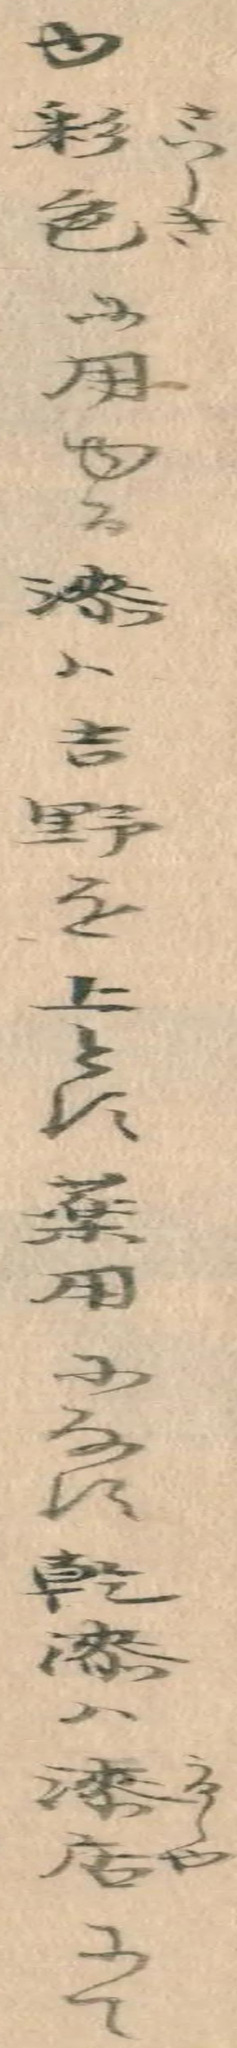ゆ彩色に用ゆる漆は吉野を上とす薬用になす乾漆は漆店にて
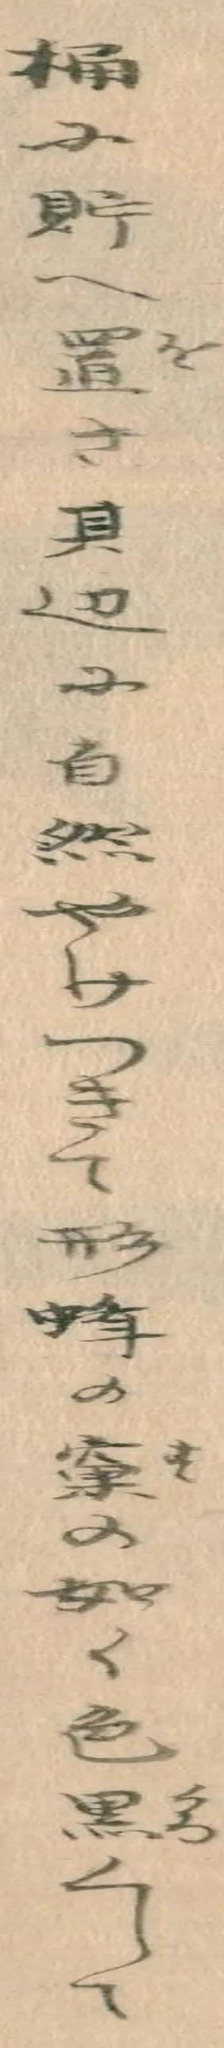桶に貯へ置き其辺に自然やけつきて形蜂の窠の如く色黒くして
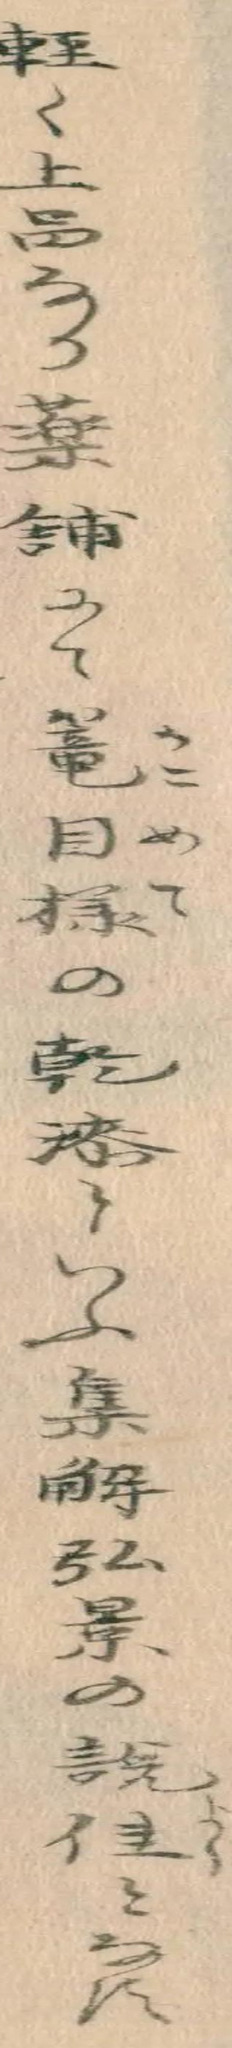軽く上品なり薬舗にて篭目様の乾漆といふ集解弘景の説佳となす
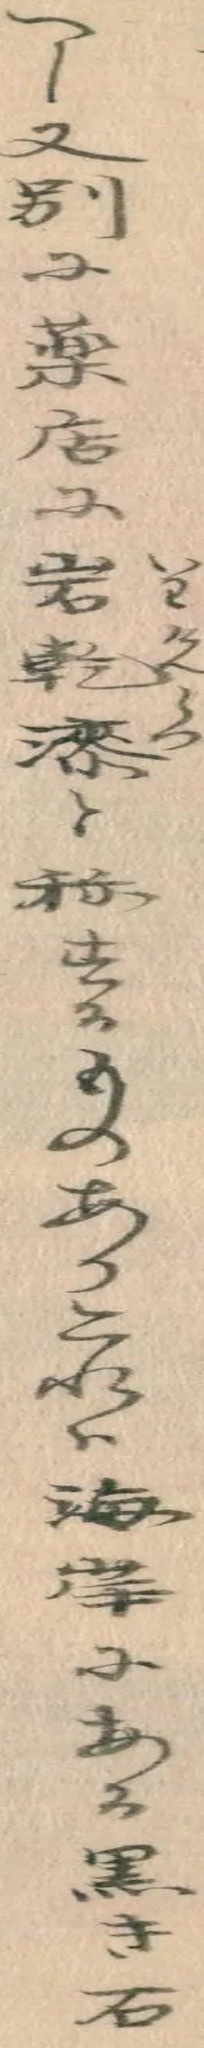へし又別に薬店に岩乾漆と称するものありこれは海岸にある黒き石
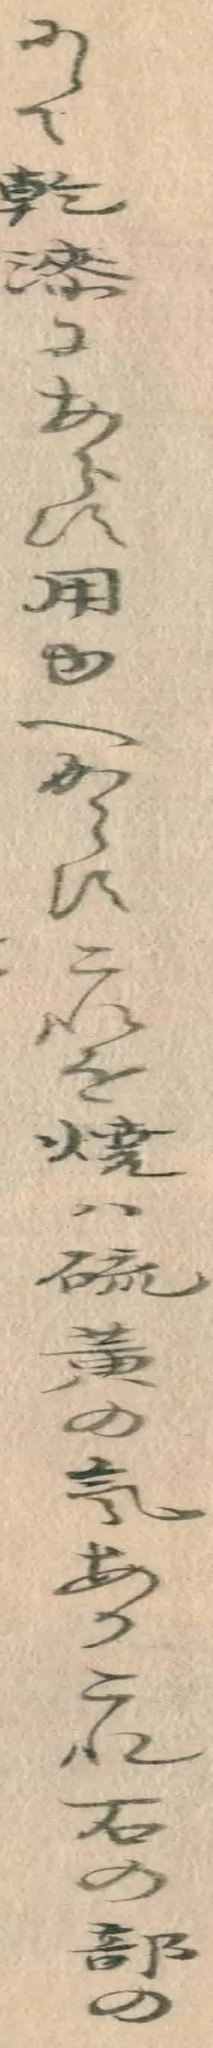にして乾漆にあらす用ゆへからすこれを焼は硫黄の気ありこれ石の部の
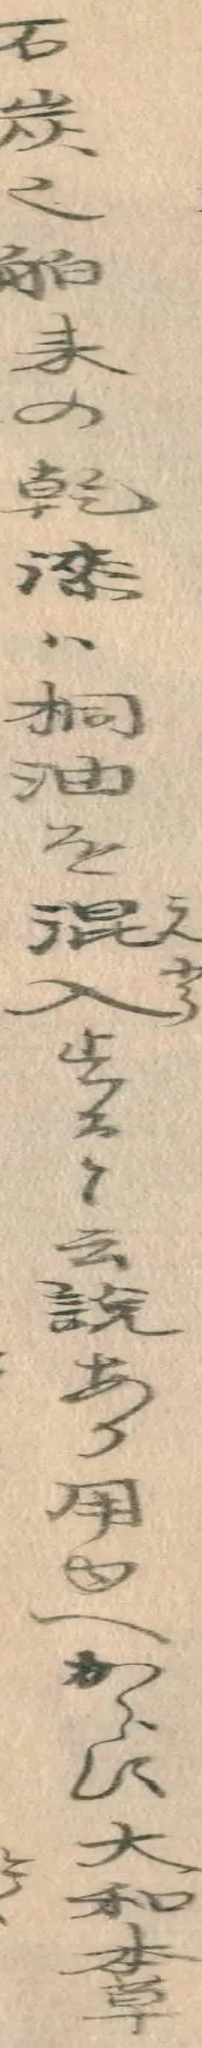石炭也舶来の乾漆は桐油を混入すると云説あり用ゆへからす大和本草
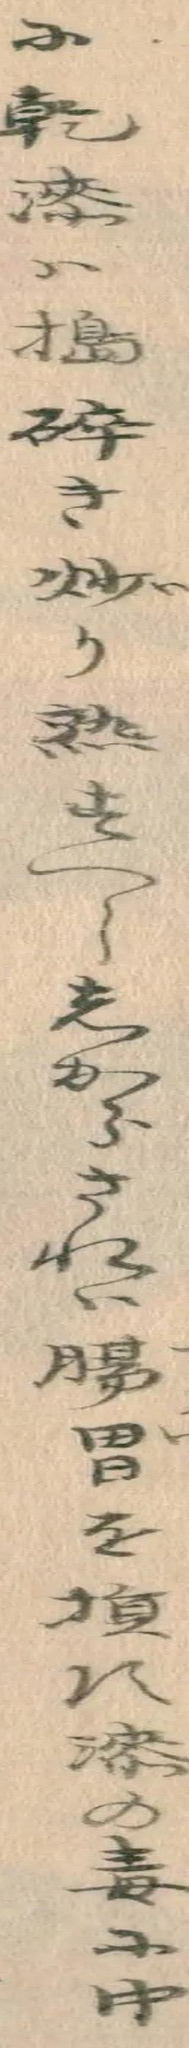に乾漆は槝砕き炒り熟すへししからされは腸胃を損す漆の毒に中
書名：本草図譜. 巻82-84
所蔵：国立国会図書館 National Diet Library, JAPAN
